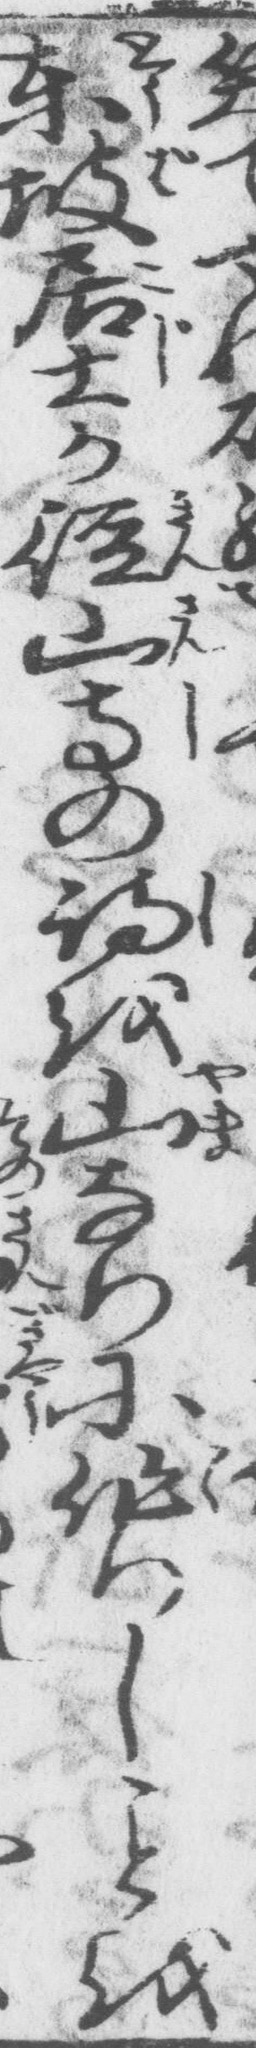東坡居士か径山寺の詩を山なりに作りしことを
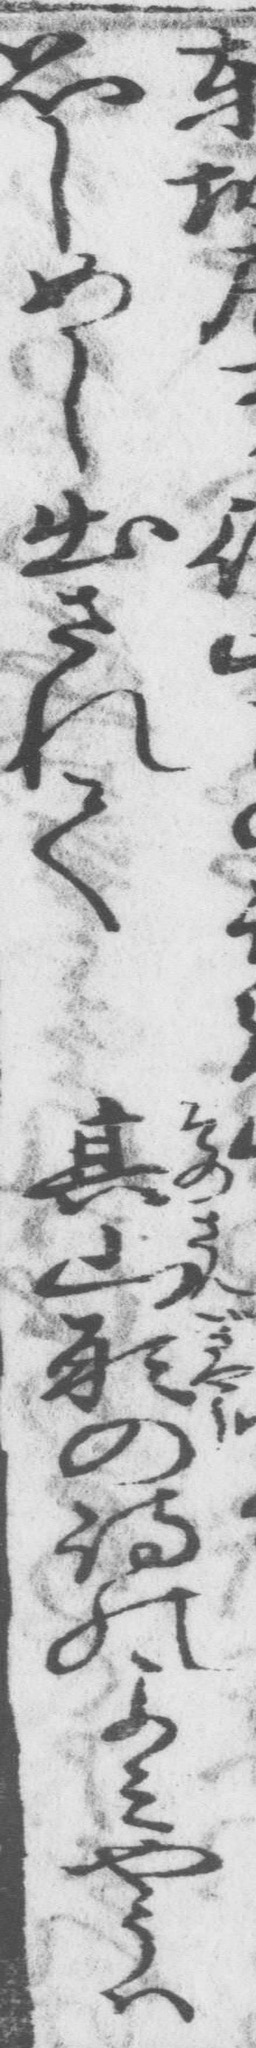思しめし出されて其山形の詩のよみやうは
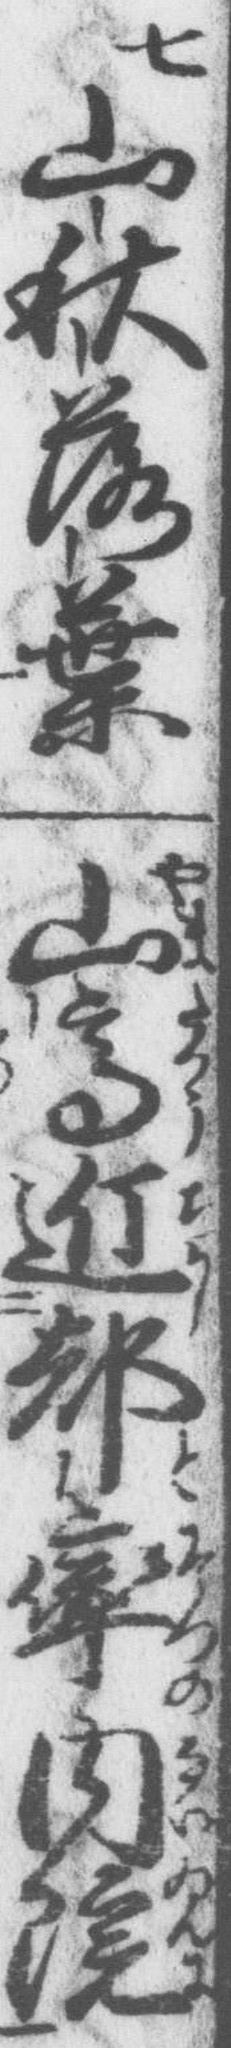七山秋落葉山高近都率内院
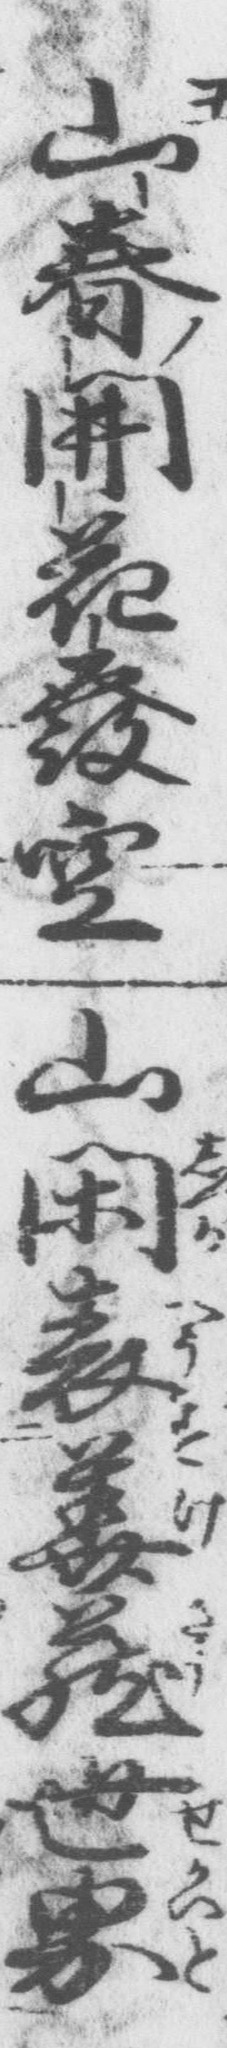五山春開花発空山閑表華蔵世界
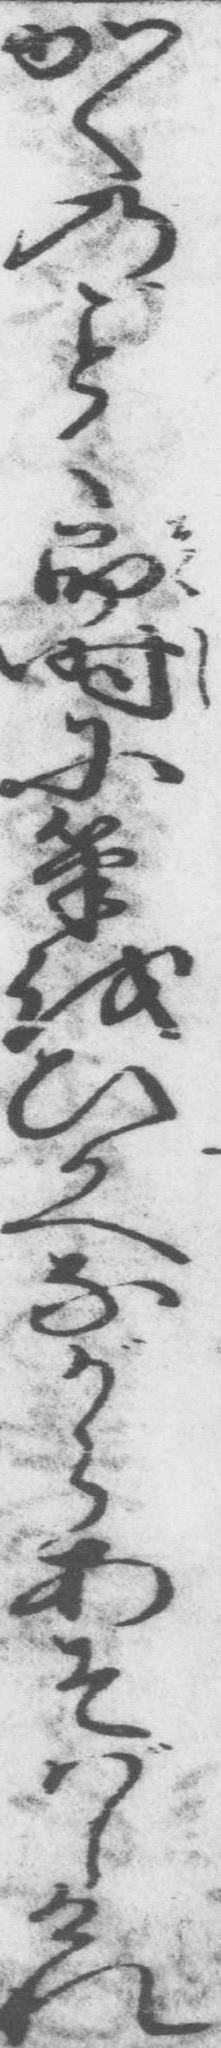かくのごとく即時に筆をひかへながらあそばしけれ
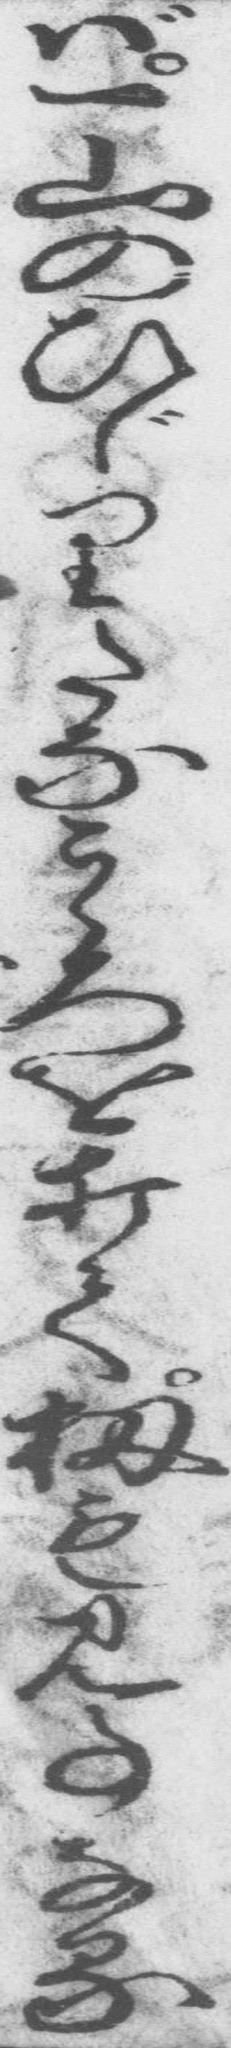ば。一山のひじりたなこゝろを打て。扨も見事なる
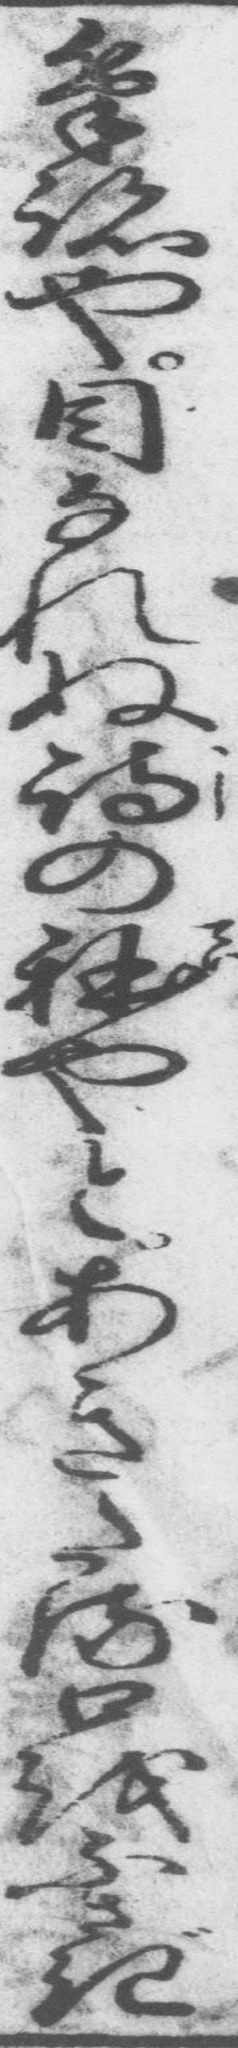筆跡や。目なれぬ詩の体やと。あきたる口をふさぎ
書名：一休はなし（元禄十三）
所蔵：大阪公立大学中百舌鳥図書館 国文学研究資料館
